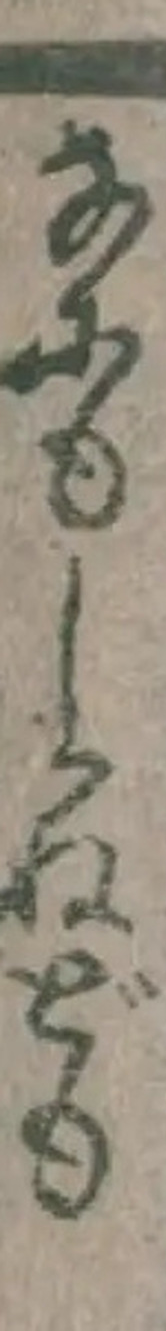なにもしらねども
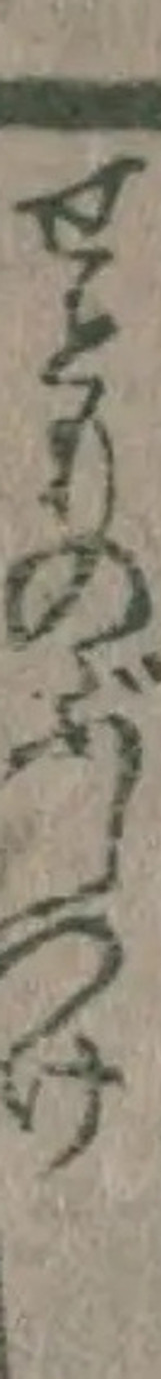せとものぶしつけ
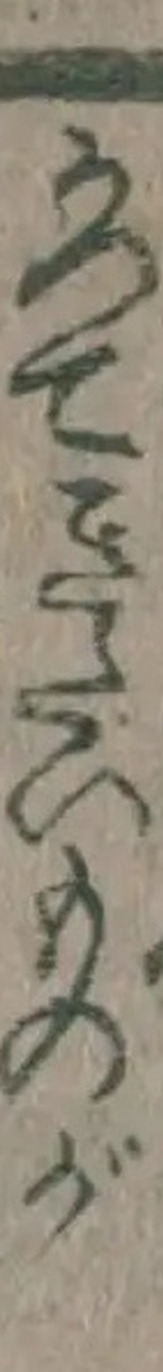かつてきたいものが
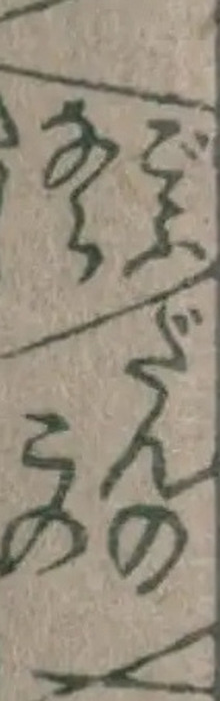ならこの
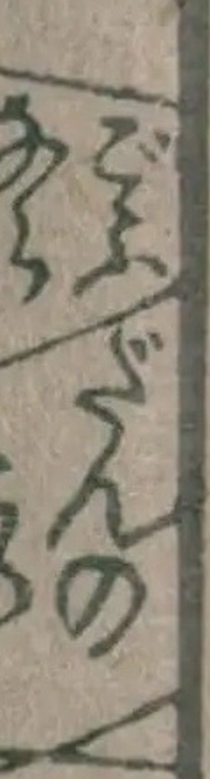ごふだんの
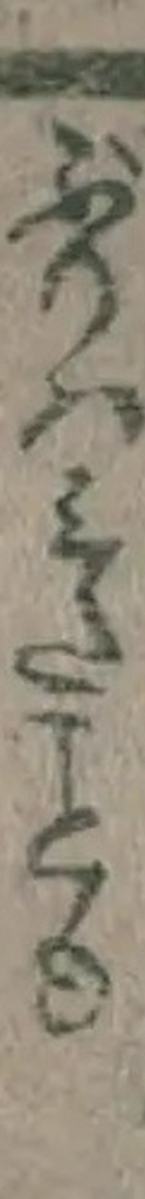ぶりはみたことも
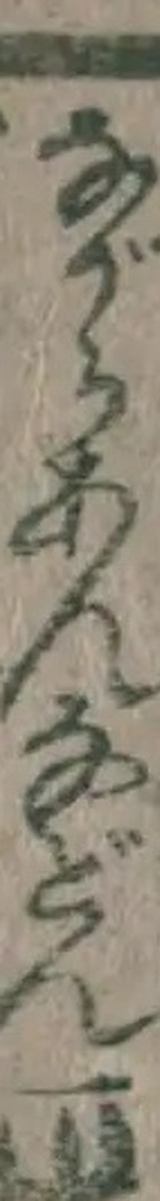ながらあんなどん
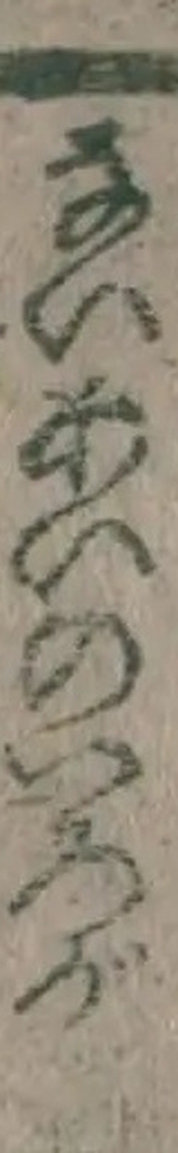ないあいのいろが
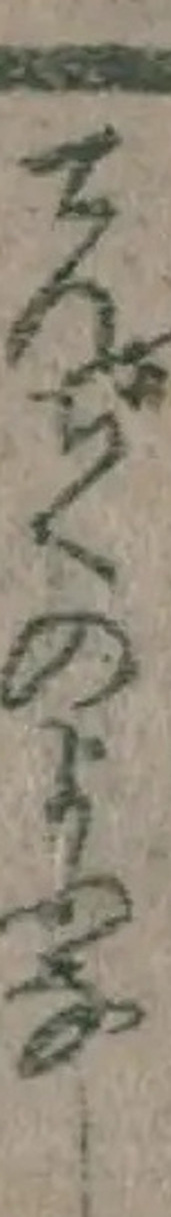てんぢくのよふな
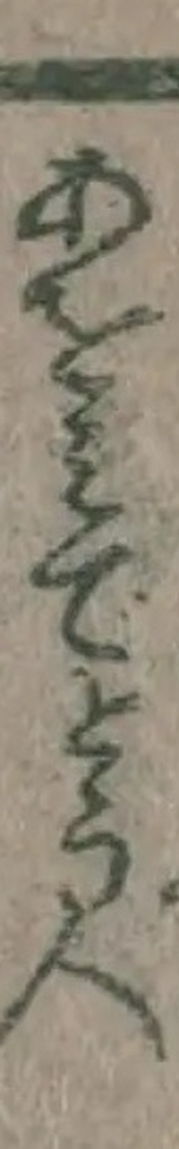あをみてとう人
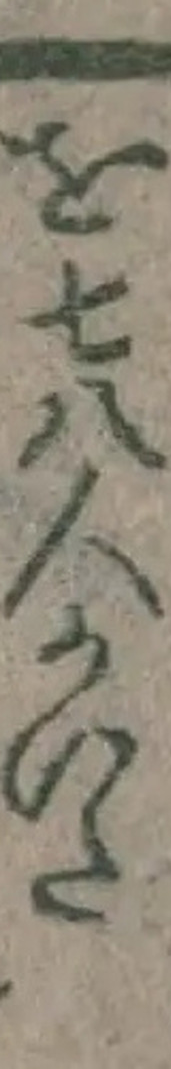を七八人かいた
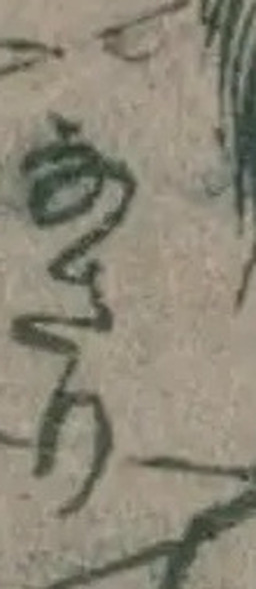なさり
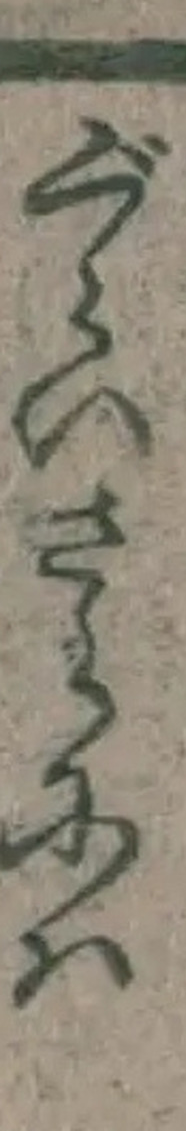ぐらいさらには
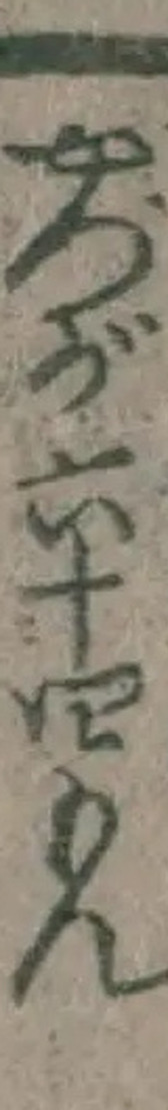やつが六十四もん
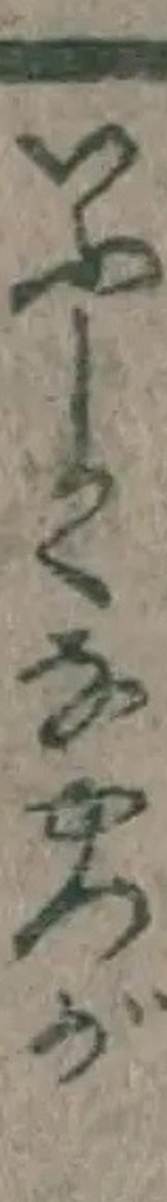いふしかくなやつが
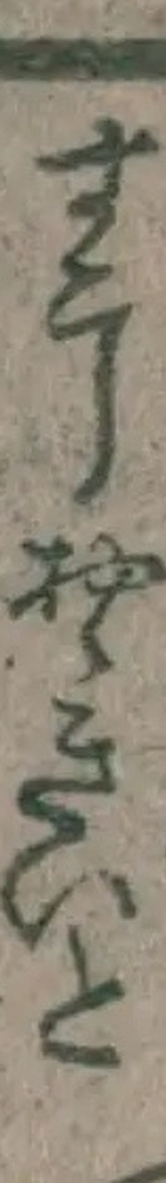すこしおゝきいと
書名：縦筒放唐の噺 3巻
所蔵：国立国会図書館 National Diet Library, JAPAN
